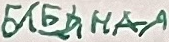бледная
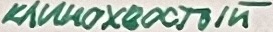клинохвостый
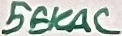бекас
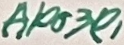дрозд
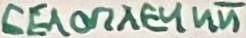белоплечий
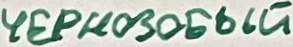чернозобый
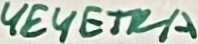чечетка
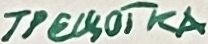трещотка
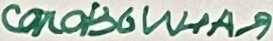соловьиная
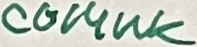сычик
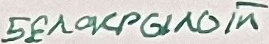белокрылый
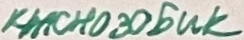краснозобик
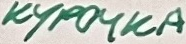курочка
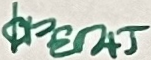фрегат
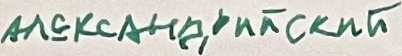александрийский
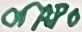огарь
